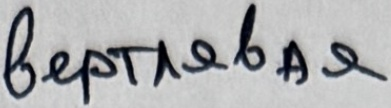вертлявая
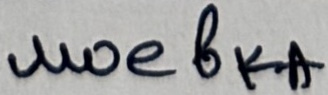моевка
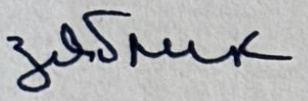зяблик
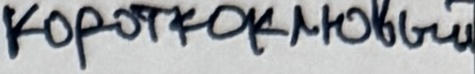короткоклювый
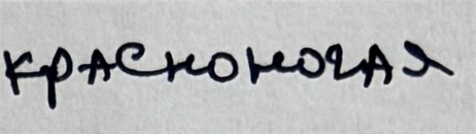красноногая
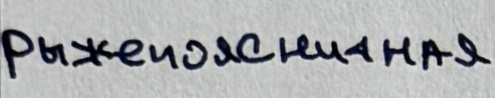рыжепоясничная
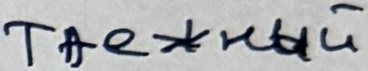таежный
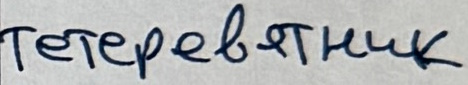тетеревятник
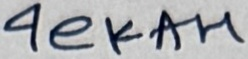чекан
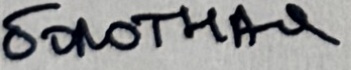болотная
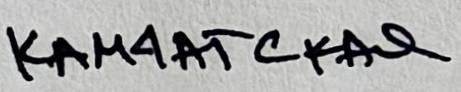камчатская
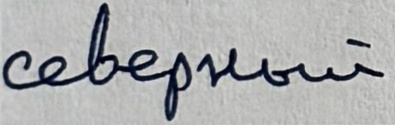северный
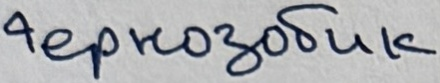чернозобик
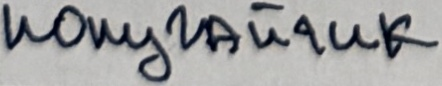попугайчик
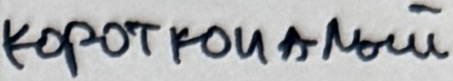короткопалый
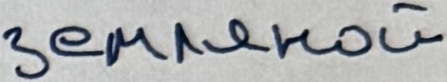земляной
